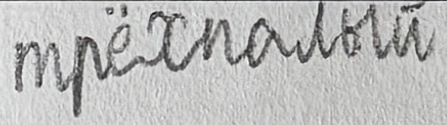трёхпалый
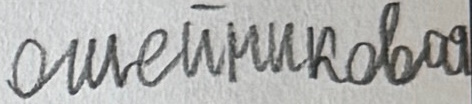ошейниковая
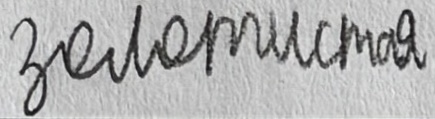зелотистая
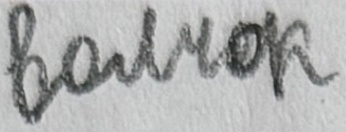волчок
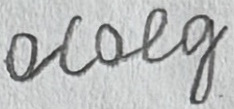осоед
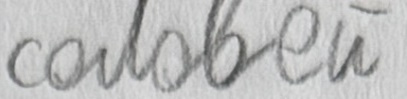соловей
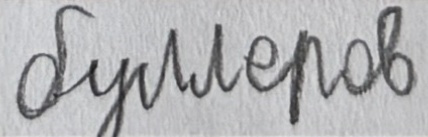буллеров
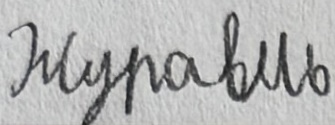журавль
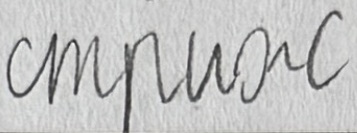стриж
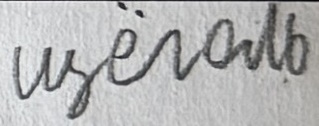щёголь
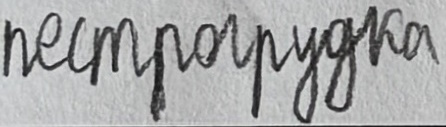пестрогрудка
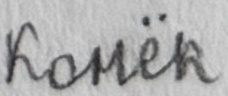конёк
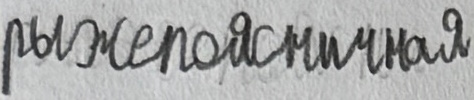рыжепоясничная
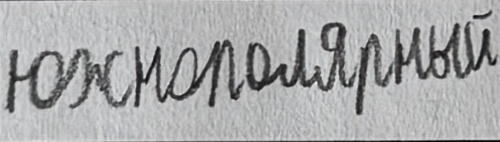южнополярный
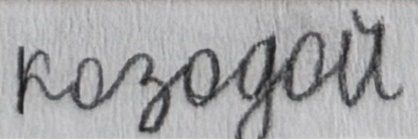козодой
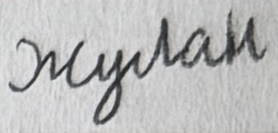жулан
